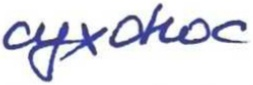сухонос
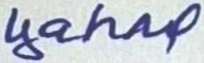цапля
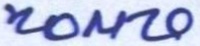чомга
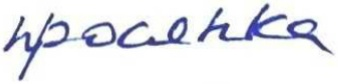просянка
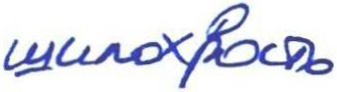шилохвость
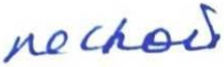песной
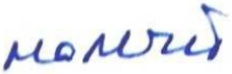молый
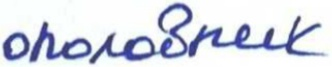ополовник
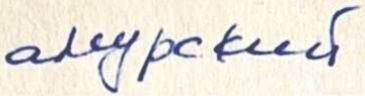амурский
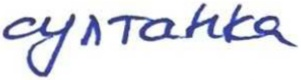султанка
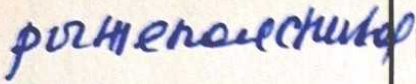рыжепоясничя
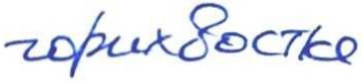горихвостка
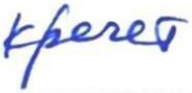кречет
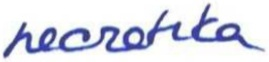песчанка
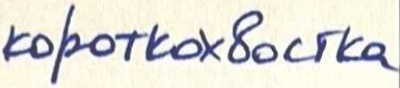короткохвостка
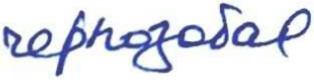чернозобая
